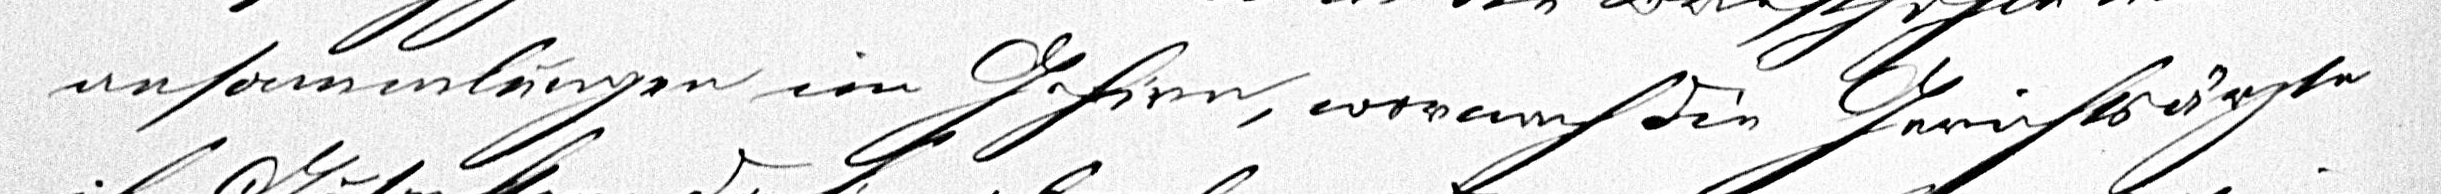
ansammlungen im Gehirn, worxx die Gerichtsärzte
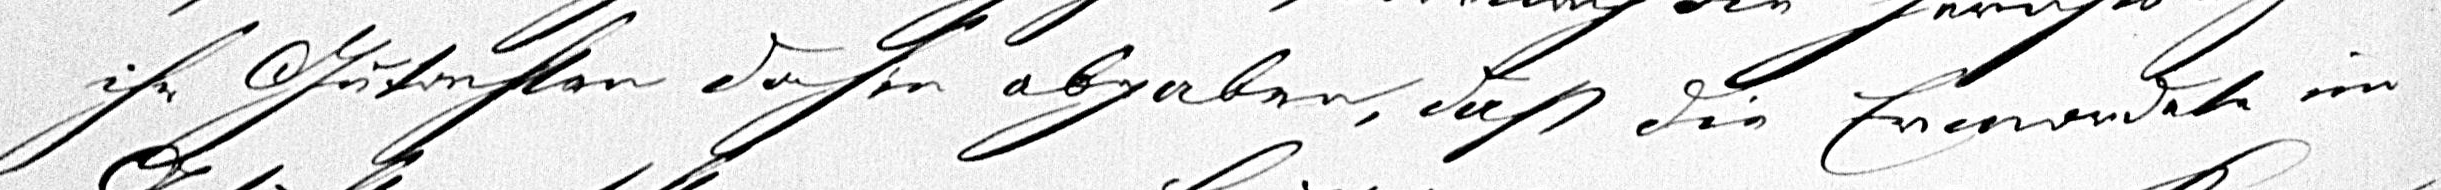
ihr Gutachten dahin abgaben, daß die Ermordete im
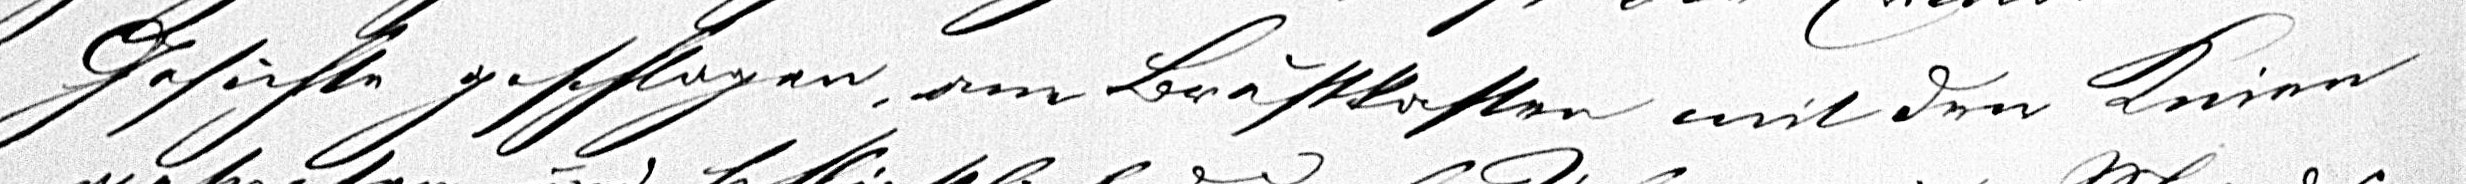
Gesichte geschlagen, am Brustkasten mit den Knien
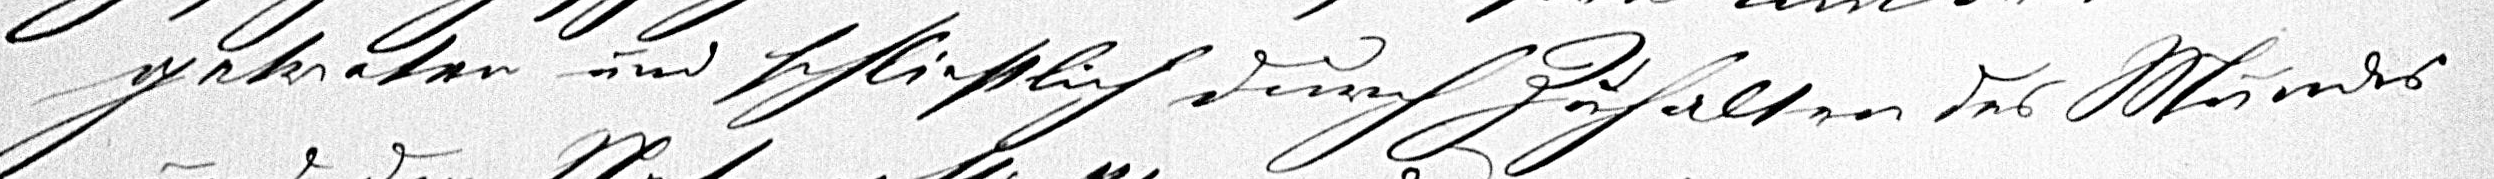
getreten und schließlich durch Zuhalten des Mundes
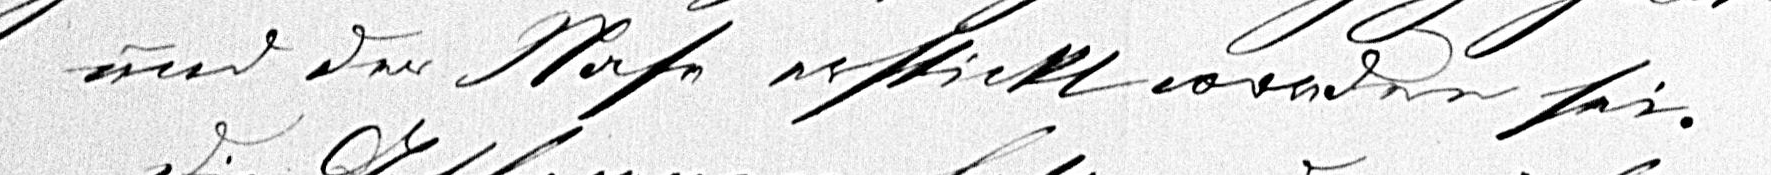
und der Nase erstickt worden sei.
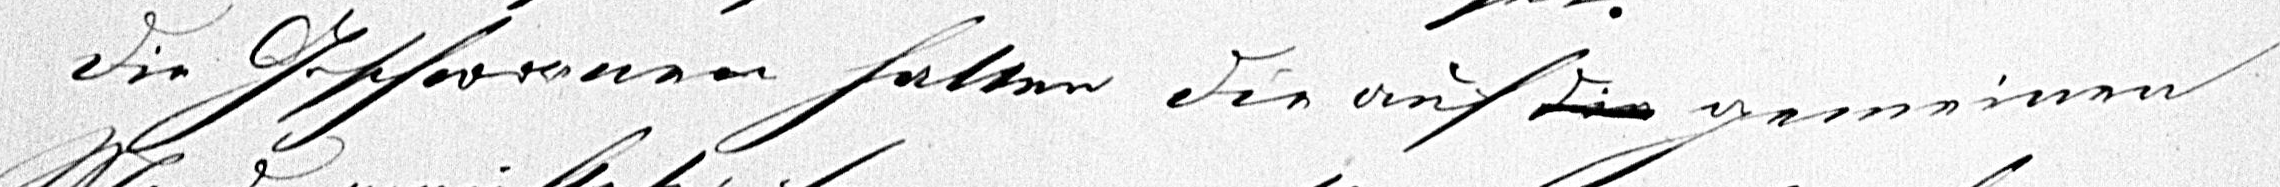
Die Geschwornen halten die auf gemeinen
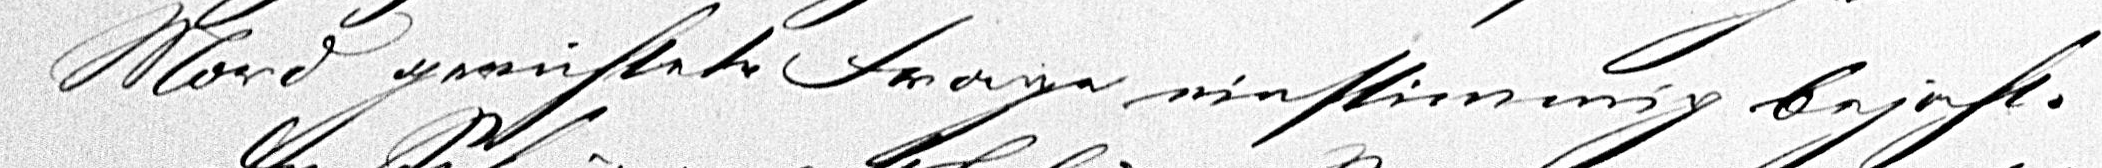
Mord gerichtete Frage einstimmig bejaht.
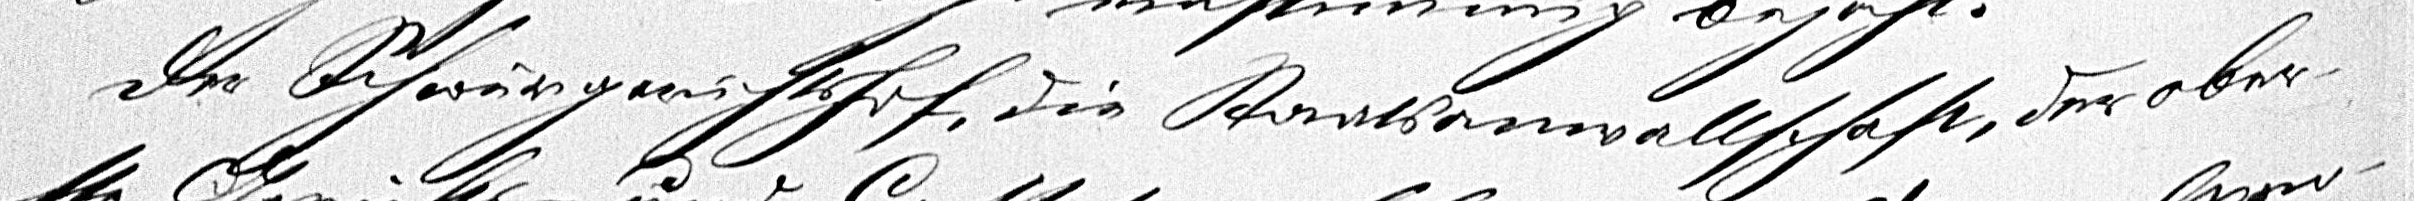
Der Schwurgerichtshof, die Staatsanwaltschaft, der ober¬
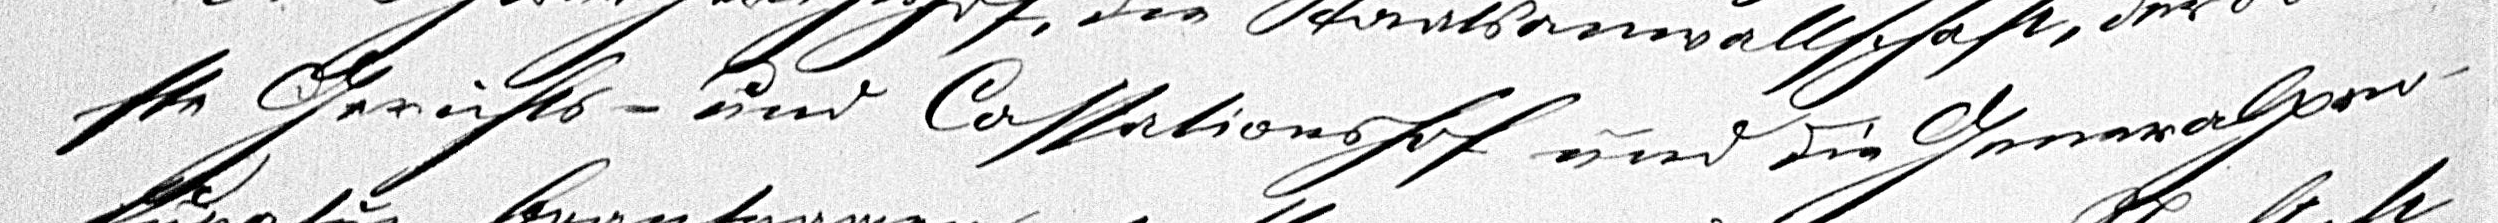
ste Gerichts- und Cassationshof und die Generalpro¬
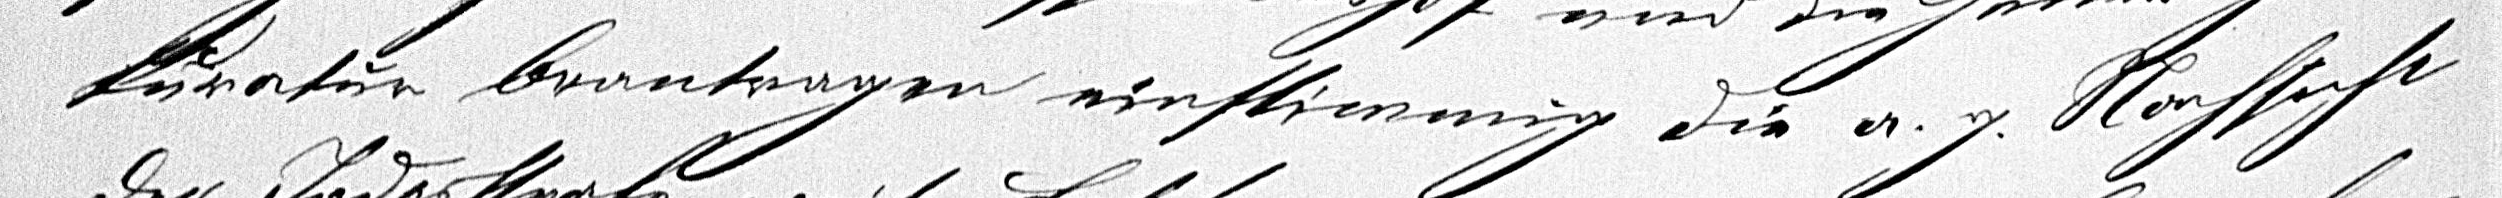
kuratur beantragen einstimmig die a. g. Nachsicht
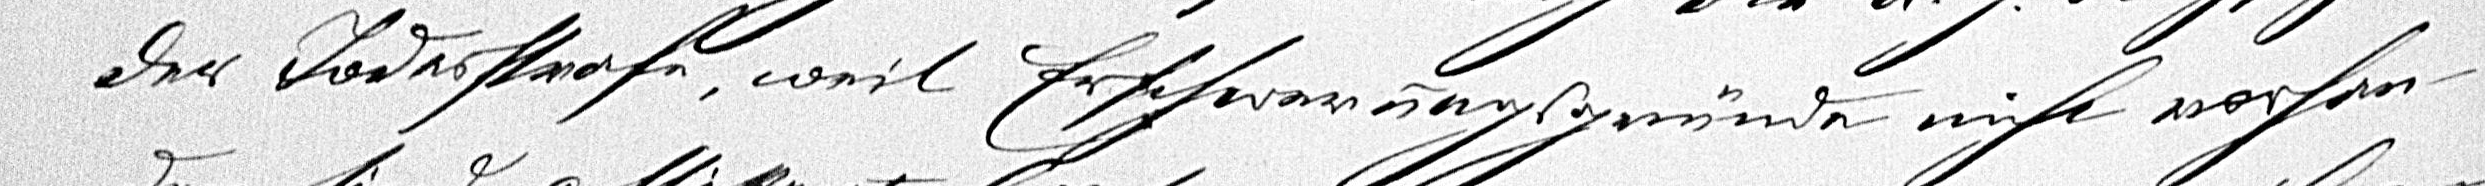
der Todesstrafe, weil Erschwerungsgründe nicht vorhan¬
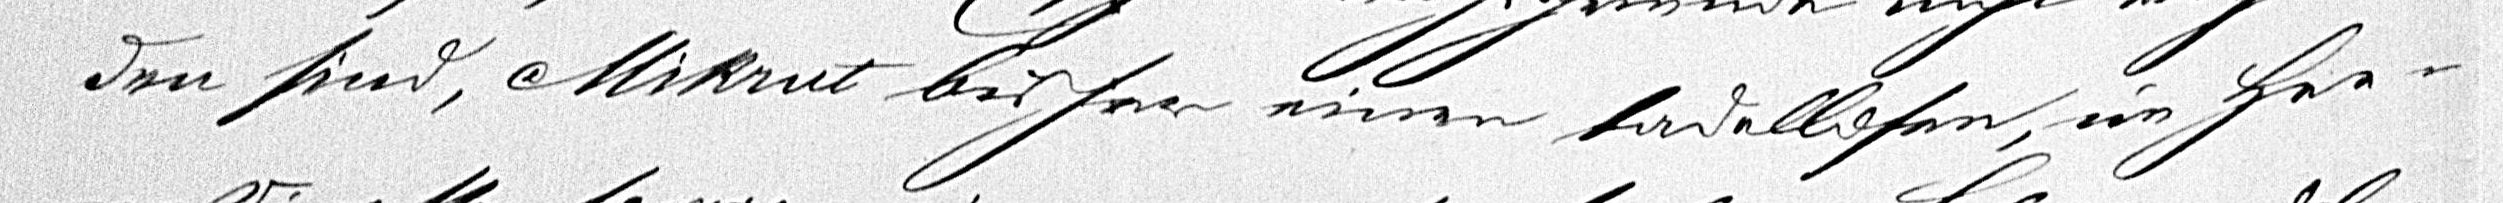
den sind, Mikrut bisher einen tadellosen, im Hee¬
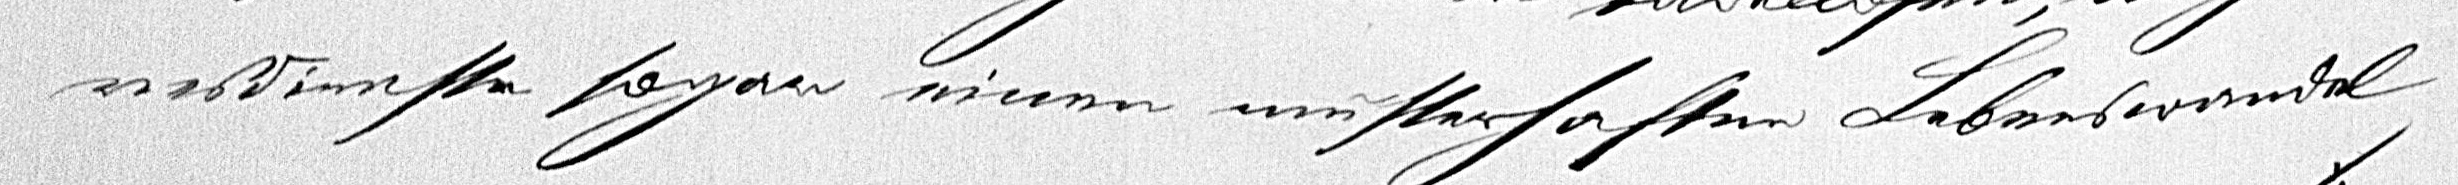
resdienste sogar einen musterhaften Lebenswandel
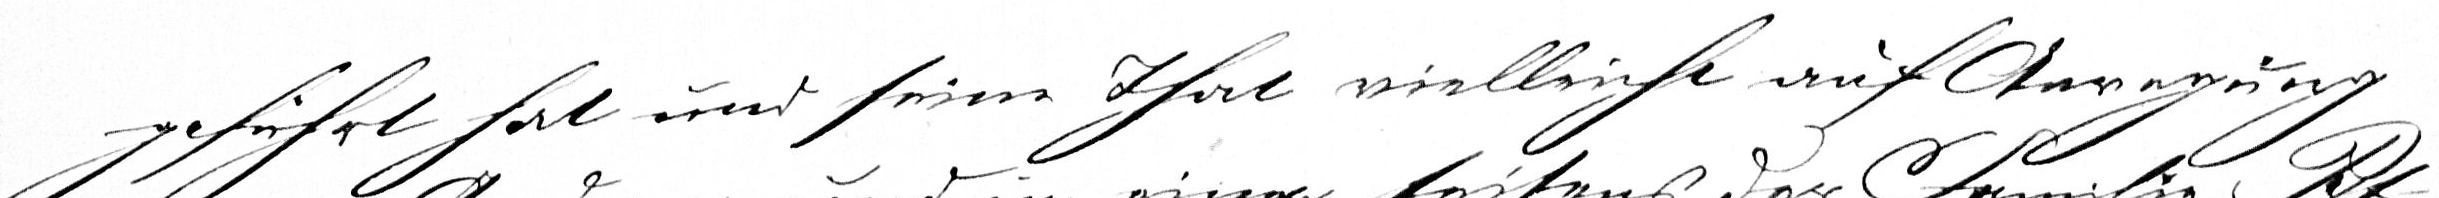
geführt hat und seine That vielleicht auf Anregung
